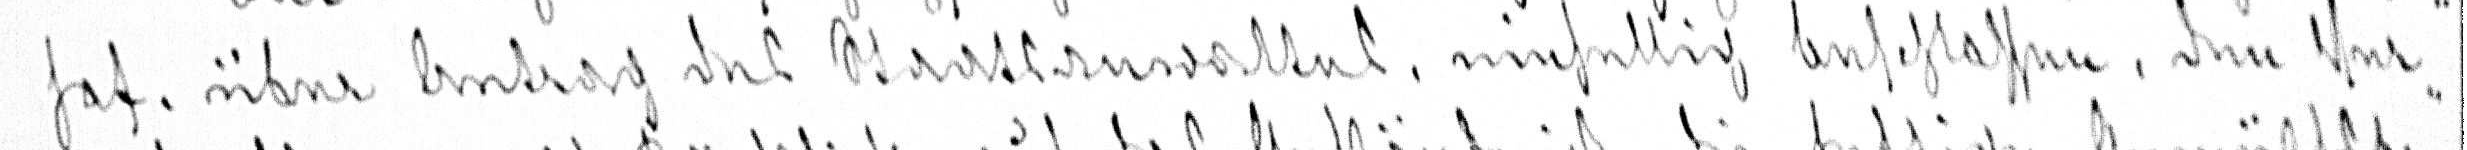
hof, über Antrag des Staatsanwaltes, einhellig beschlossen, den Ver¬
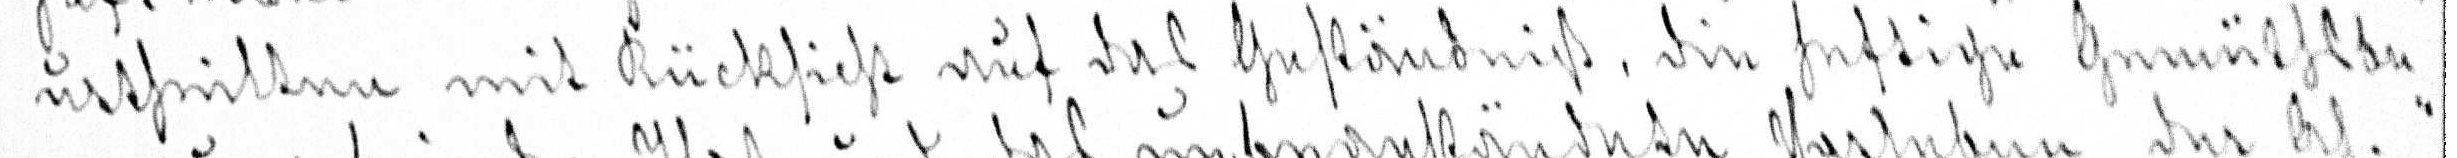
urtheilten mit Rücksicht auf das Geständniß, die heftige Gemüthsbe¬
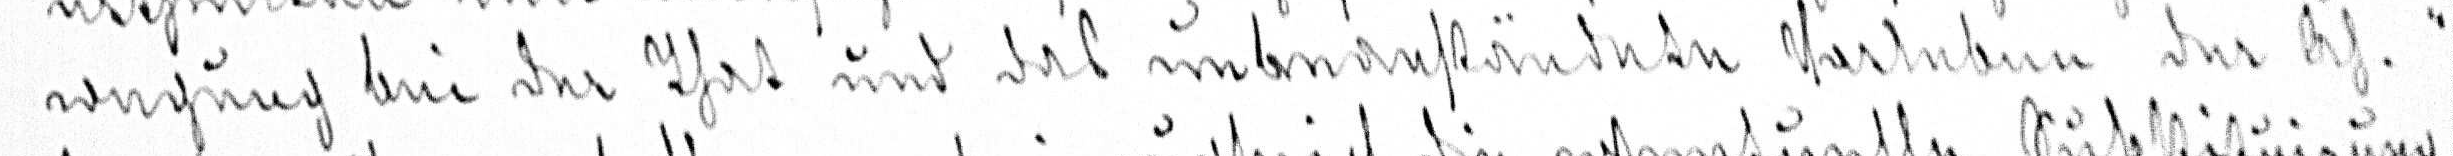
wegung bei der That und das unbeanständete Vorleben der Ah.
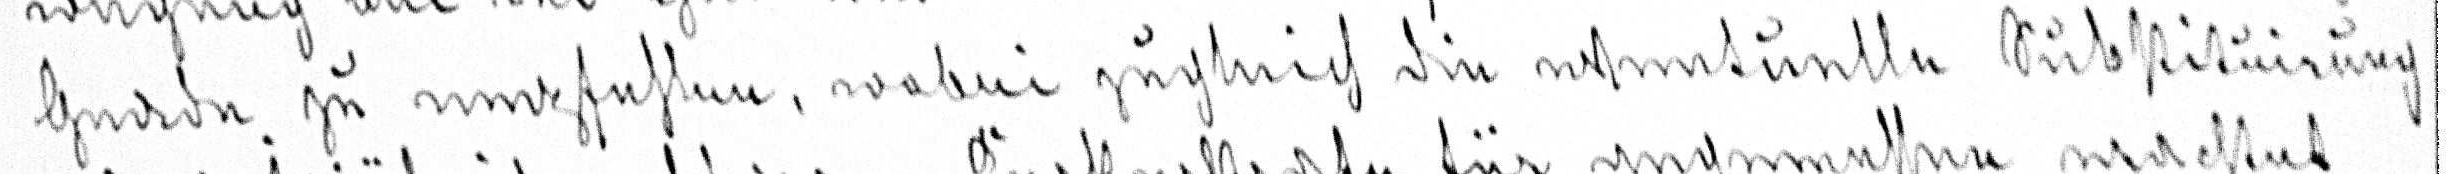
Gnade zu empfehlen, wobei zugleich die eventuelle Substituirung
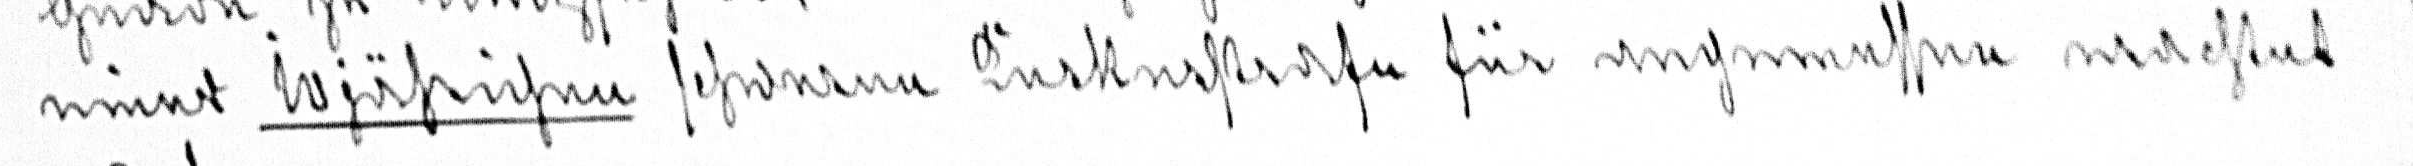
einer 20 jährige schweren Kerkerstrafe für angemessen erachtet
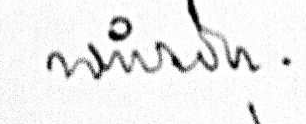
wurde.
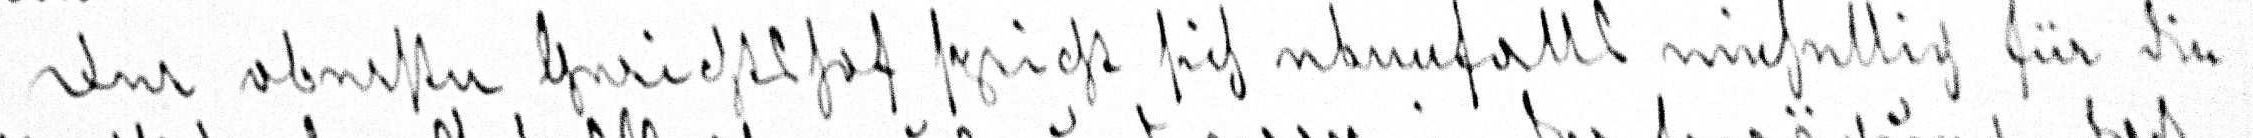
Der oberste Gerichtshof spricht sich ebenfalls einhellig für die
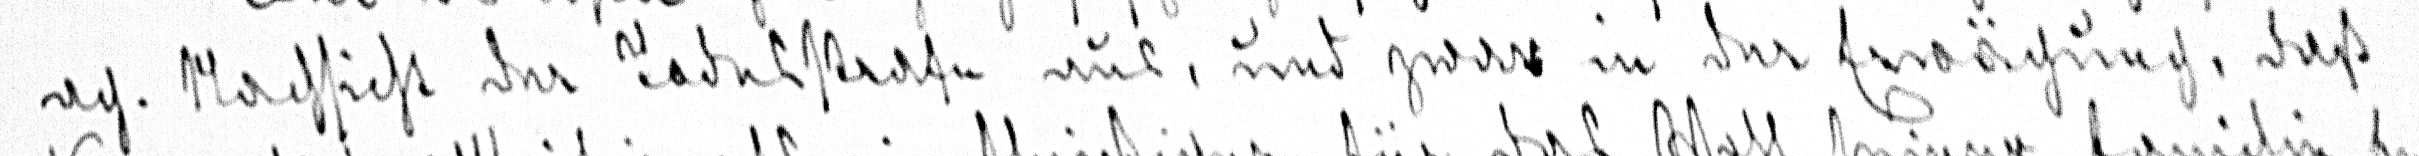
ag. Nachsicht der Todesstrafe aus, und zwar in der Erwägung, daß
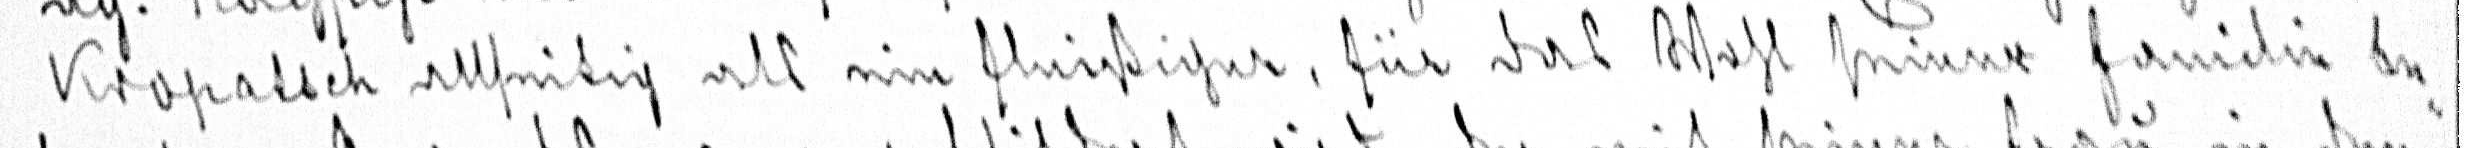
Kropatsch allseitig als ein fleißiger, für das Wohl seiner Familie be¬
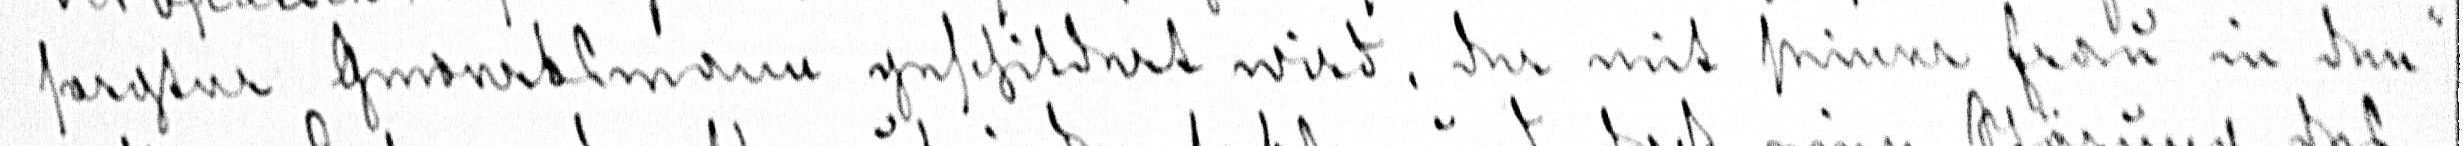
sorgter Gewerksmann geschildert wird, der mit seiner Frau in den
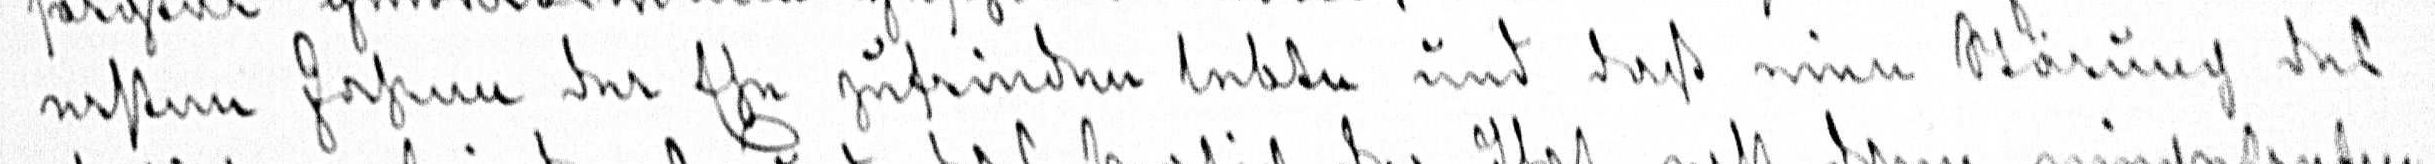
ersten Jarhen der Ehe zufrieden lebte und daß eine Störung des
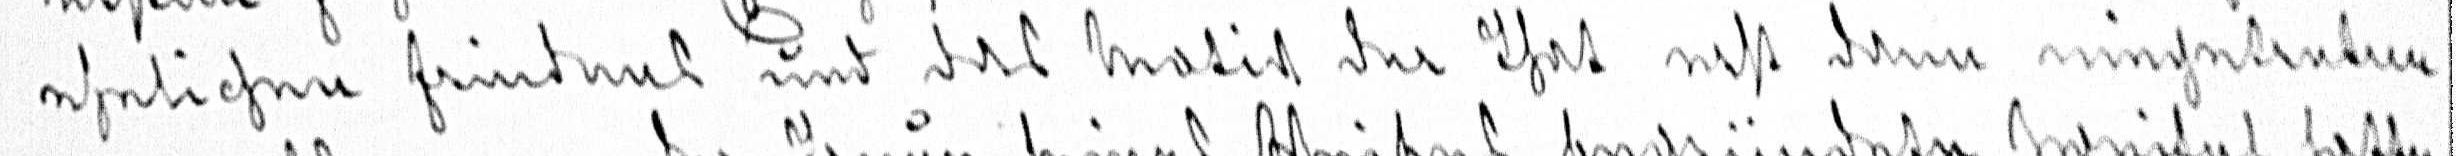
ehelichen Friedens und des Motiv der That erst dann eingetreten
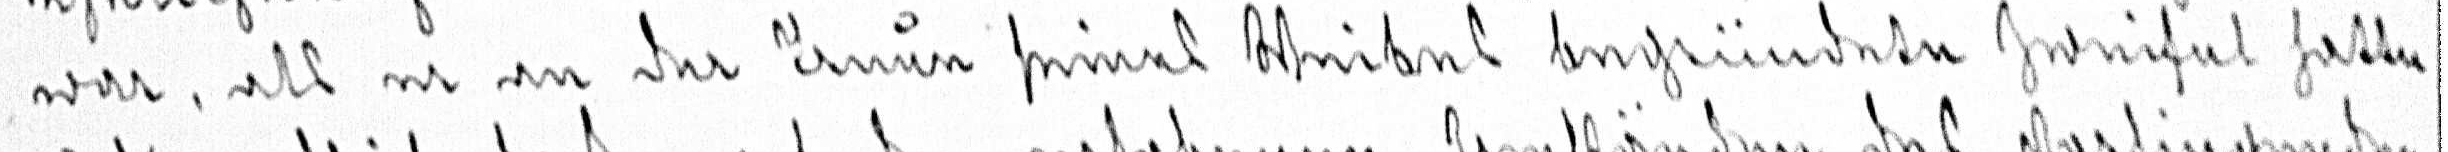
war, als er an der Treue seines Weibes begründete Zweifel hatte
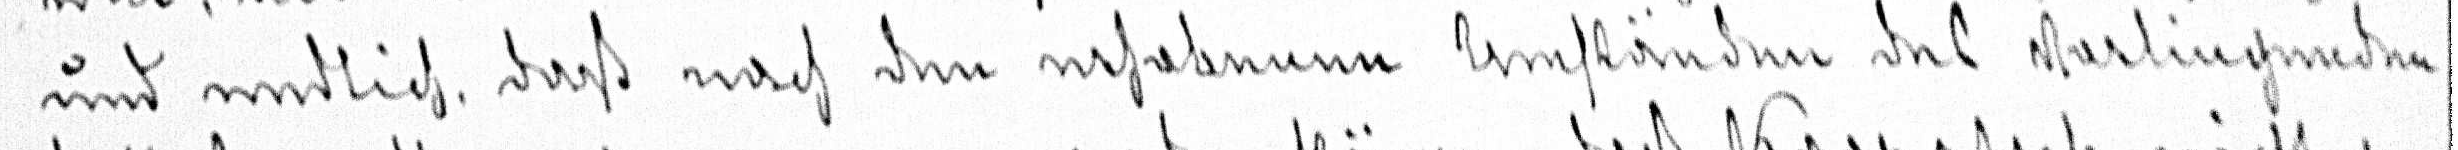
und endlich, daß nach den erhobenen Umständen des vorliegenden
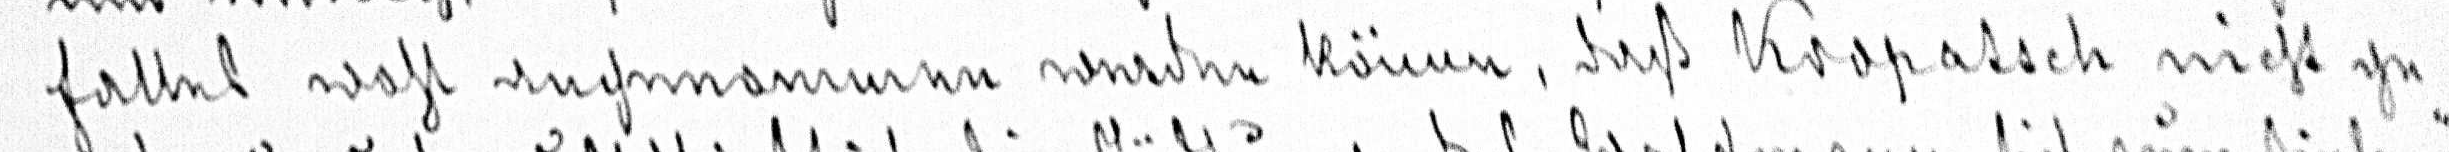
Falles wohl angenommene werden könne, daß Kropatsch nicht ge¬
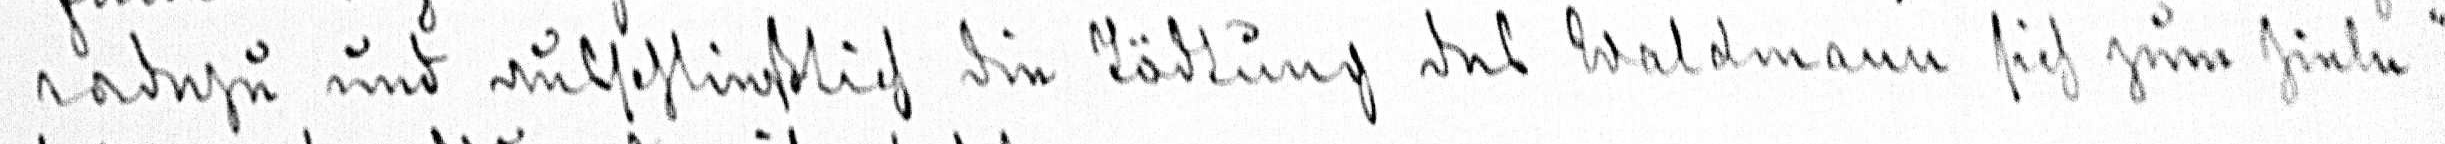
radezu und ausschließlich die Tödtung des Waldmann sich zum Ziele
